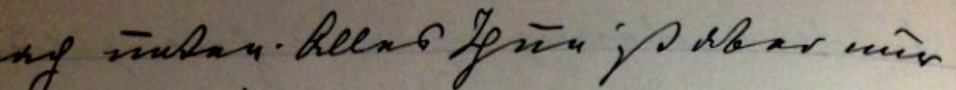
nach unten. Alles Thun ist aber nur
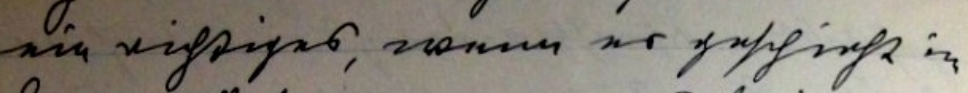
ein richtiges, wenn es geschieht im
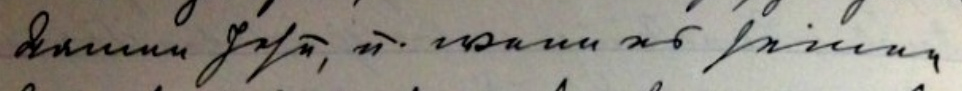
Namen Jesu, u. wenn es seinen
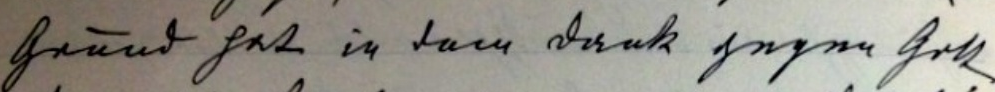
seinen Grund hat in dem Dank gegen Gott,
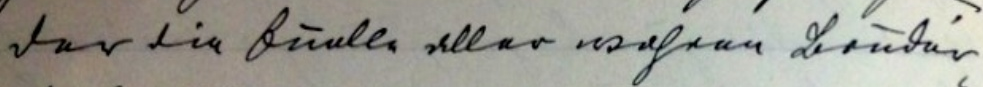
der die Quelle aller wahren Bruder
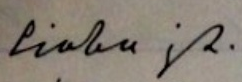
liebe ist.
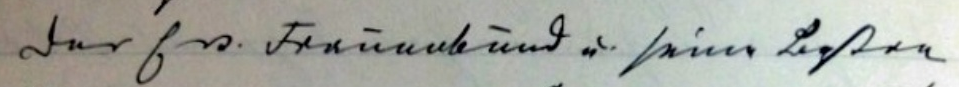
Der Ev. Frauenbund u. seine Bestre
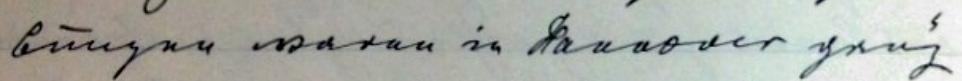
bungen waren in Hannover ganz
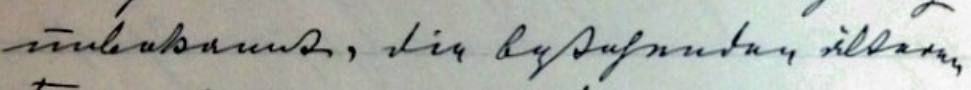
unbekannt, die bestehenden älteren
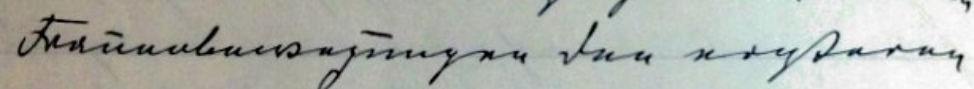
Frauenbewegungen den ernsteren
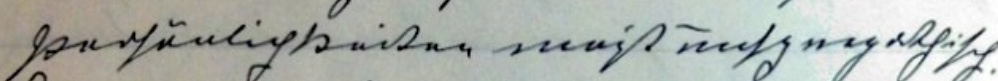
Persönlichkeiten meist unsympathisch.
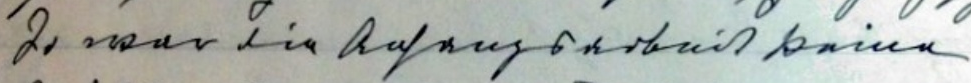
So war die Anfangsarbeit keine
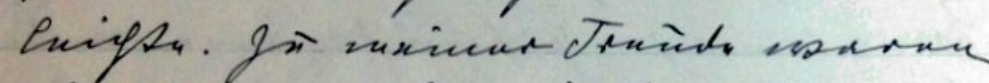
leichte. Zu meiner Freude waren
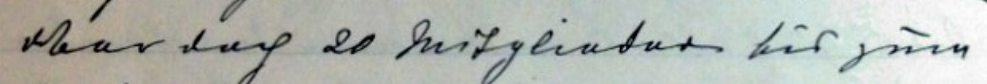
aber doch 20 Mitglieder bis zum
